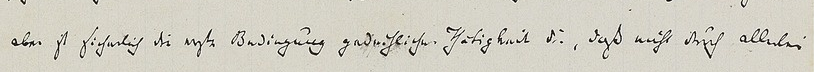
aber ist sicherlich die erste Bedingung gedeihlicher Thätigkeit die, daß nicht durch allerlei
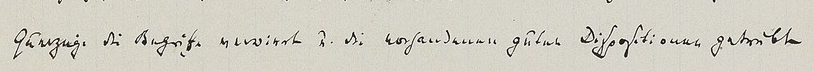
Querzüge die Begriffe verwirrt u. die vorhandenen guten Dispositionen getrübt
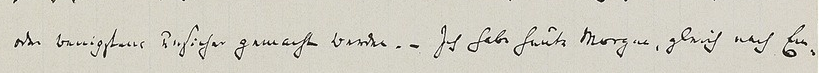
oder wenigstens unsicher gemacht werden. – Ich habe heute Morgen, gleich nach Em-
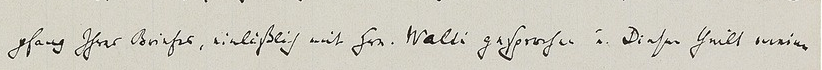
pfang Ihres Briefes, einläßlich mit Hrn. Welti gesprochen u. Dieser theilt meine
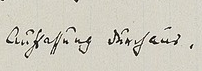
Auffassung durchaus.
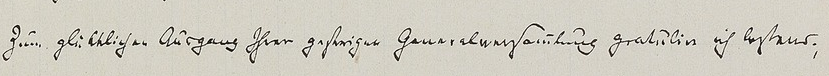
Zum glükklichen Ausgang Ihrer gestrigen Generalversammlung gratulire ich bestens;
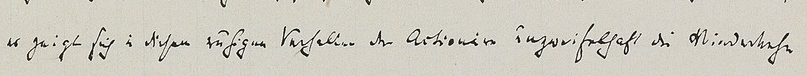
es zeigt sich in diesem ruhigen Verhalten der Actionäre unzweifelhaft die Wiederkehr
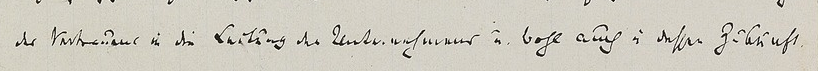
des Vertrauens in die Leitung des Unternehmens u. wohl auch in dessen Zukunft.
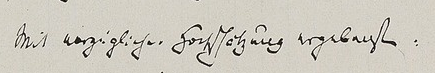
Mit vorzüglicher Hochschätzung ergebenst:
